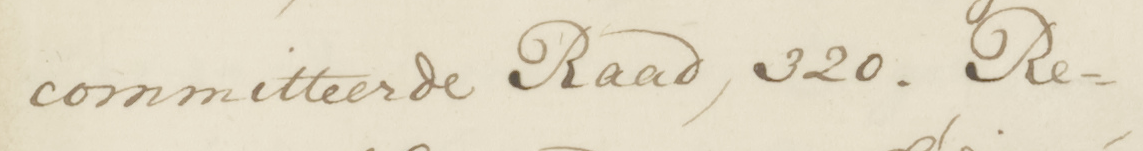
committeerde Raad, 320. Re=
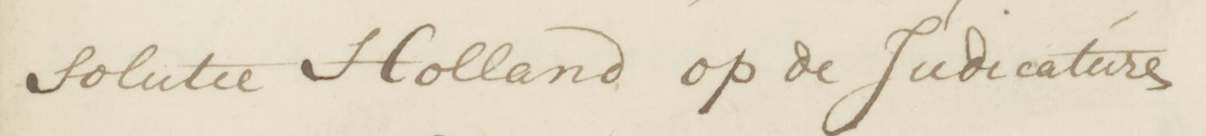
solutie Holland op de Judicature,
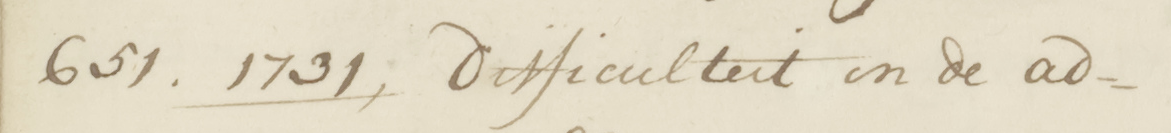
651. 1731, difficulteit in de ad=
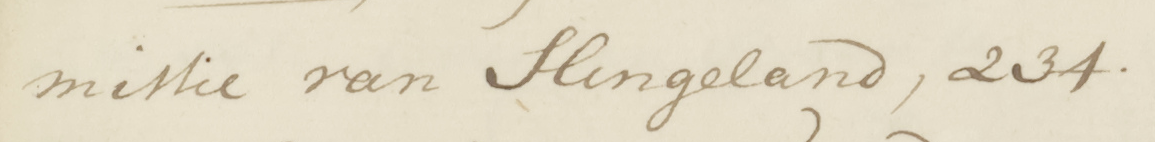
missie van Slingeland, 234.
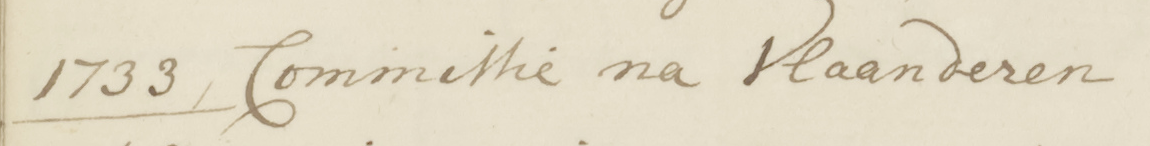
1733, Commissie na Vlaanderen
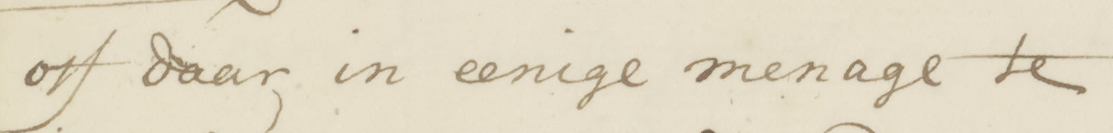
off daar in eenige menage te
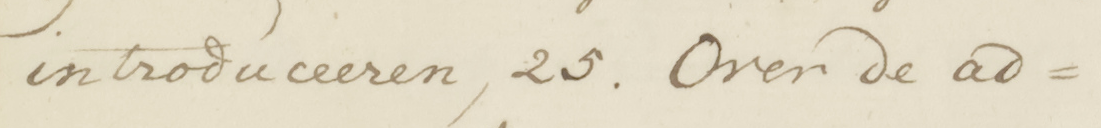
introduceeren, 25. Over de ad=
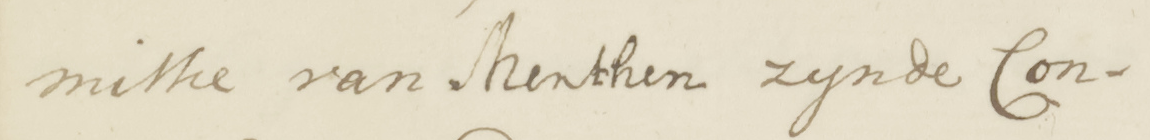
missie van Menthen zynde Con„.
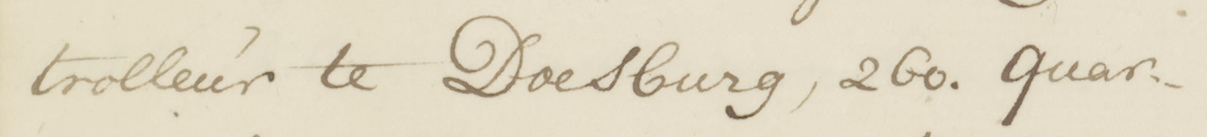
trolleur te Doesburg, 260. Quar„
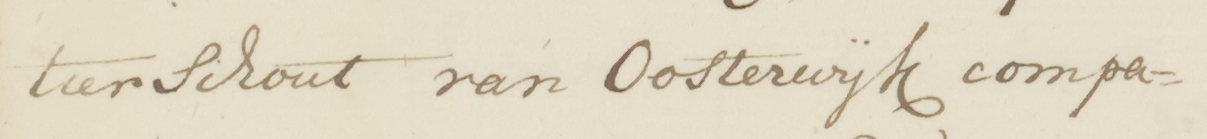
tierschout van Oosterwijk compa=
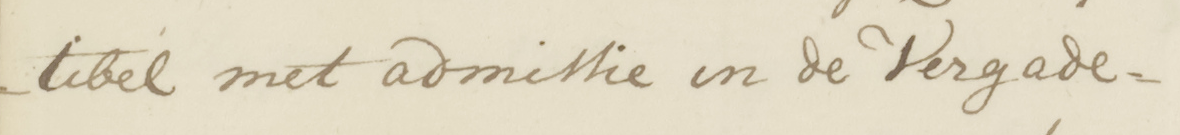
„tibel met admissie in de Vergade=
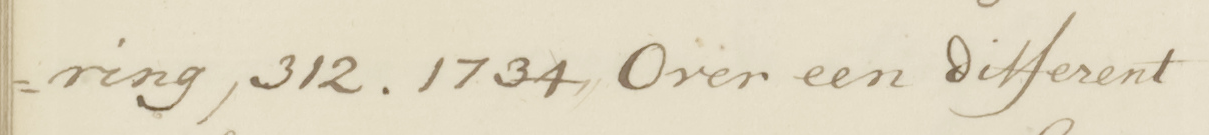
=ring, 312. 1734, Over een different
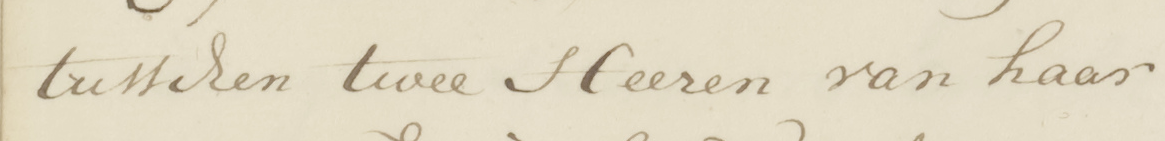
tusschen twee Heeren van haar
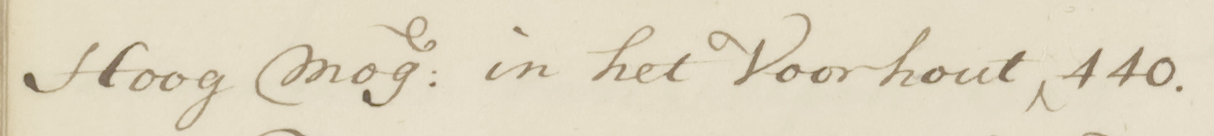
Hoog Moge: in het Voorhout, 440.
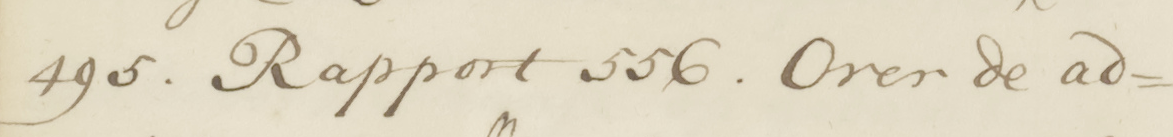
495. Rapport 556. Over de ad=
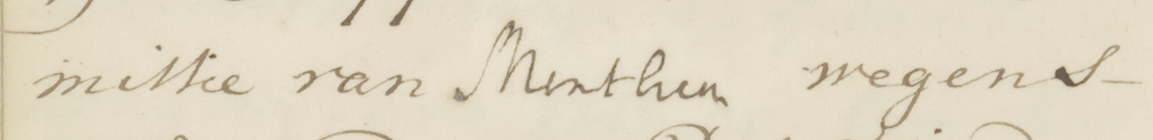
missie van Menthen wegens
